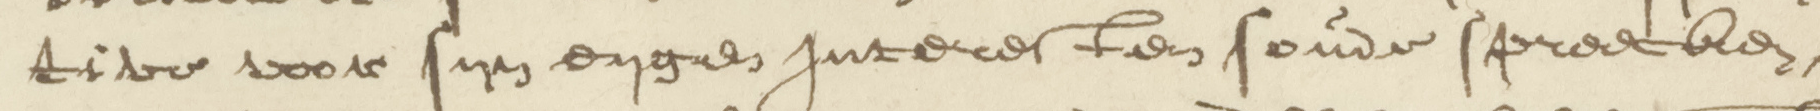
tive voor syn eygen interesten soude spreecken,
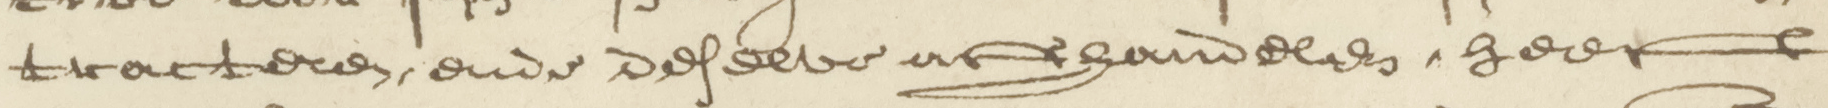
tracteren, ende deselve affhandelen, heeft
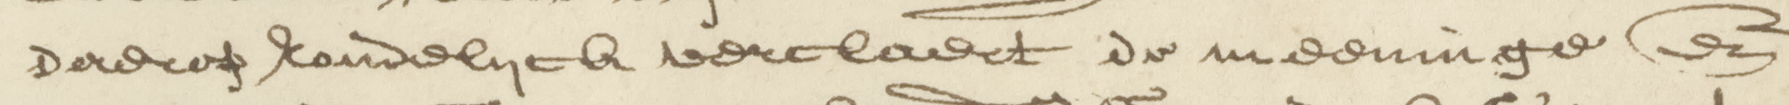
daerop rondelyck verclaert de meeninge en
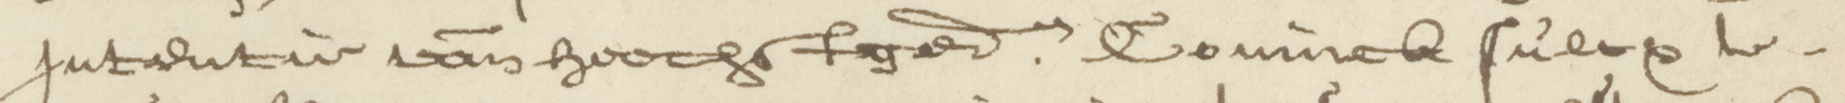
intentie van hoochstgeden Coninck sulcx te
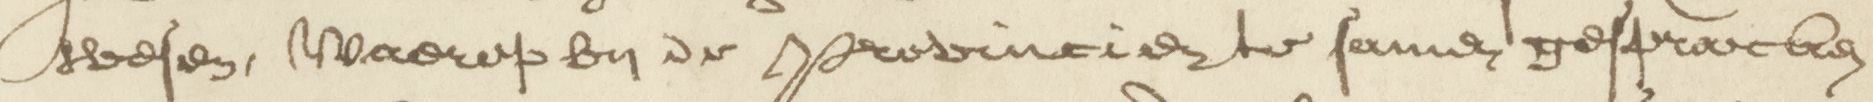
wesen. Waerop bij de provincien te samen gesproocken
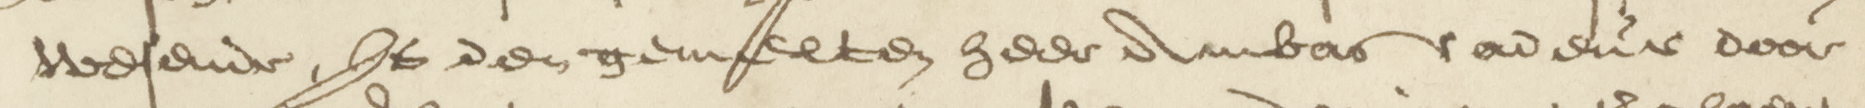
wesende, Is den gemelten heer Ambassadeur door
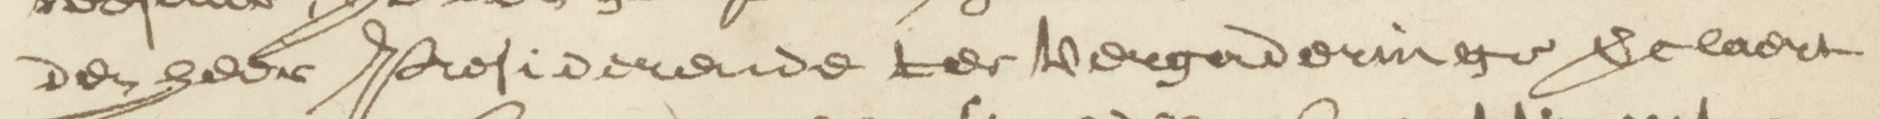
den heer presiderende ter vergaderinge verclaert
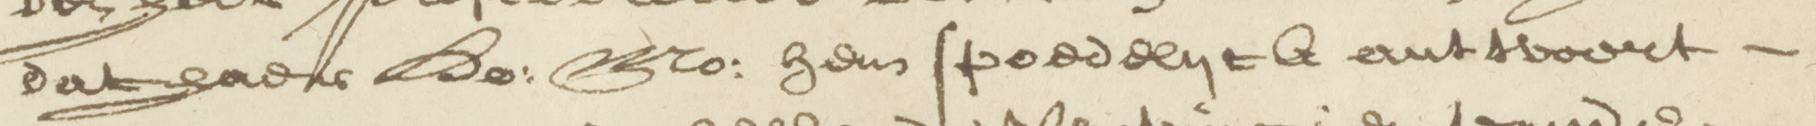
dat haer Ho:Mo: geen spoedelyck antwoort -
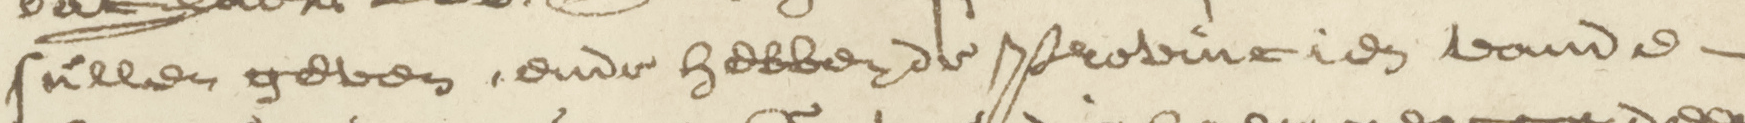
sullen geven, ende hebben de provincien vande -
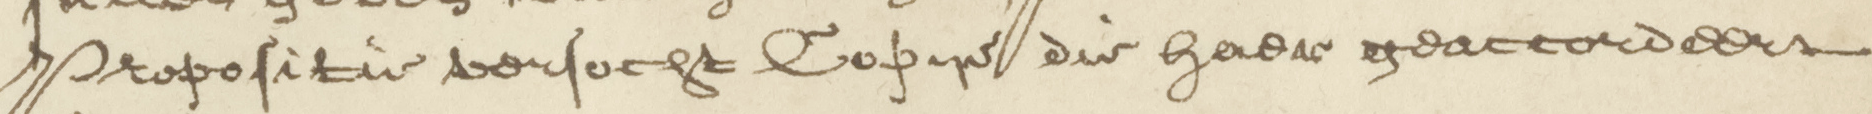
propositie versocht copye die haer geaccordeert
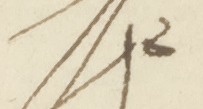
Is.
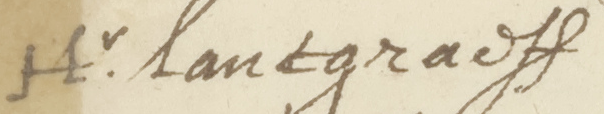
Hr. Lantgraeff
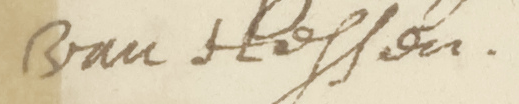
van Hessen
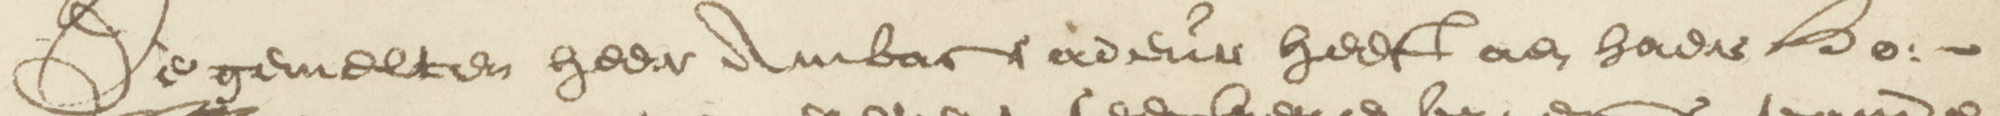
De gemelten heer Ambassadeur heeft aen haer Ho:
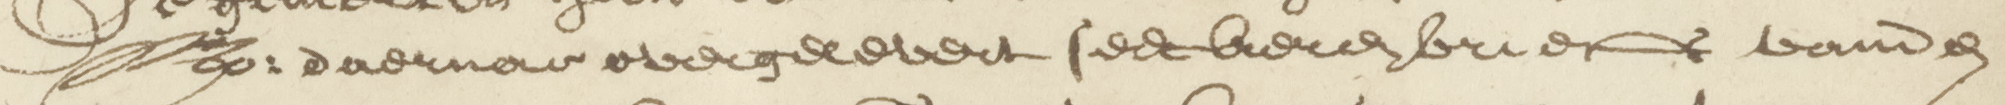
Mo: daernae overgelevert seeckeren brieff vanden
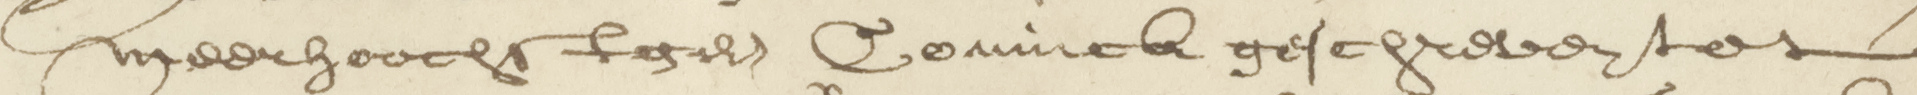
meerhoochstged Coninck geschreven tot
